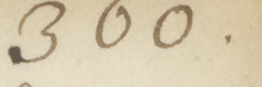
360.
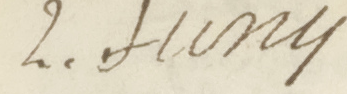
2. Junij.
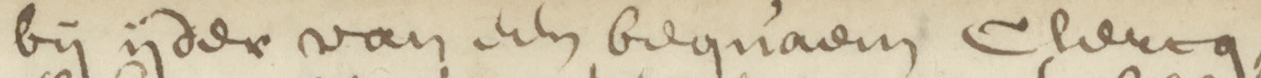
bij ijder van een bequaem Clercq,
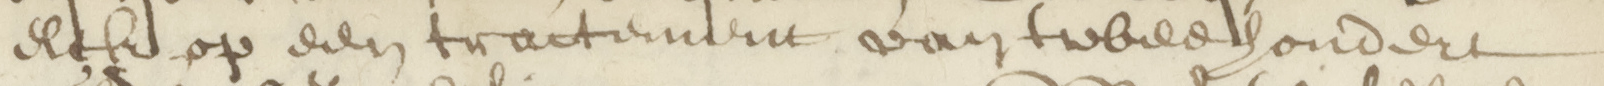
elck op een tractement van tweehondert
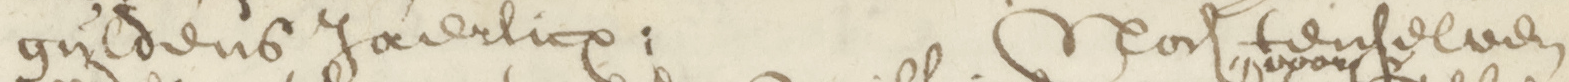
guldens Jaerlicx: Noch tenselven
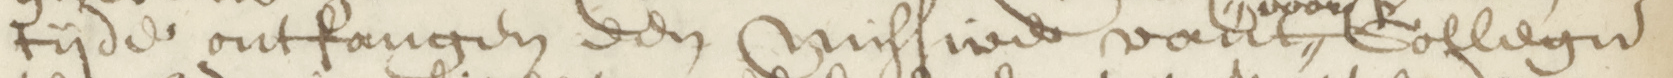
tijde ontfangen een Missive vant#voors, Collegie
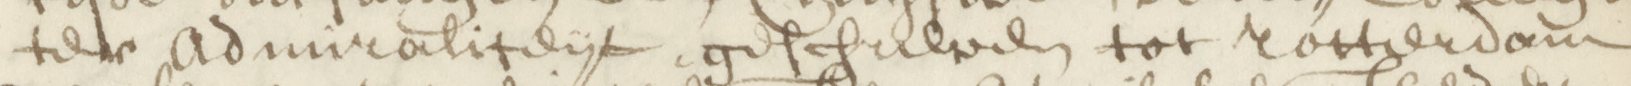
ter Admiraliteijt, geschreven tot rotterdam
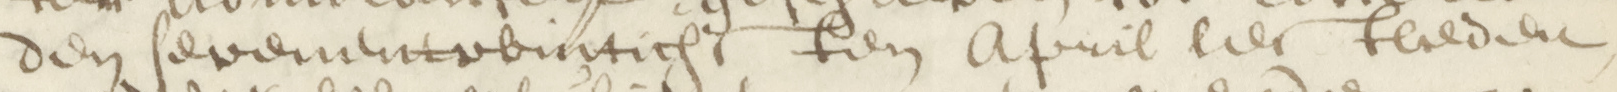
den sevenentwintichsten April lestleden,
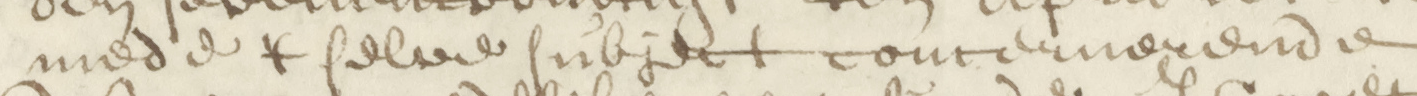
mede 't selve subject concernerende:
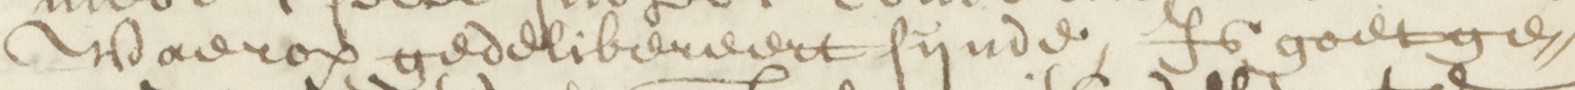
Waerop gedelibereert sijnde, Is goetge„
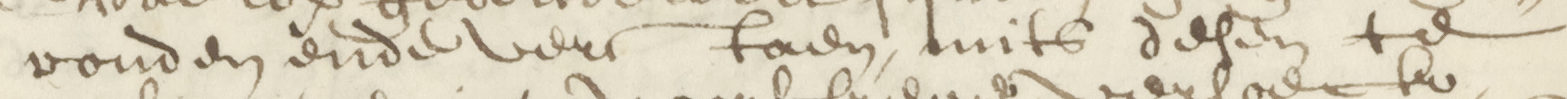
vonden ende verstaen, mits desen te
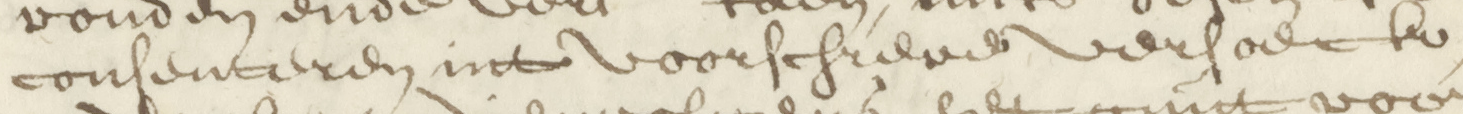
consenteren int voorschreve versoeck,
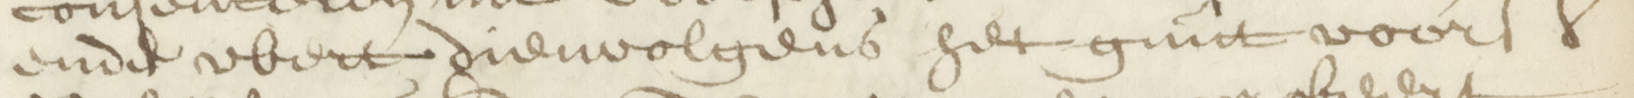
ende wert dienvolgens het gunt voors
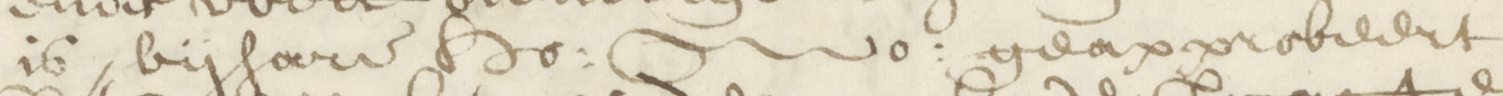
is, bij hare Ho:Mo: geapprobeert.
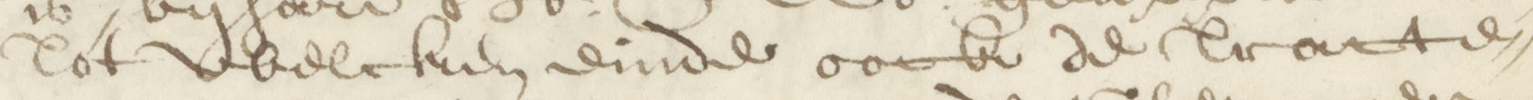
Tot welcken einde oock de Tracte„
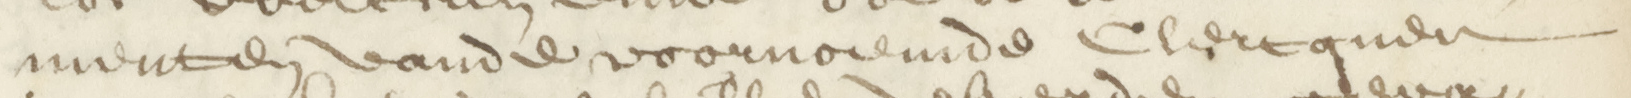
menten vande voornoemde Clercquen
